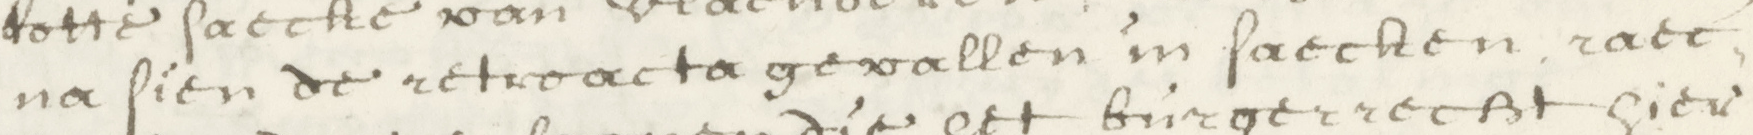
na sien de retroacta gevallen in saecken, raec,,
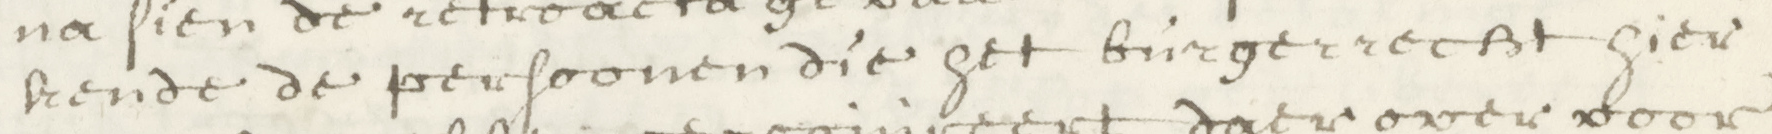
kende de persoonen die het burgerrecht hier
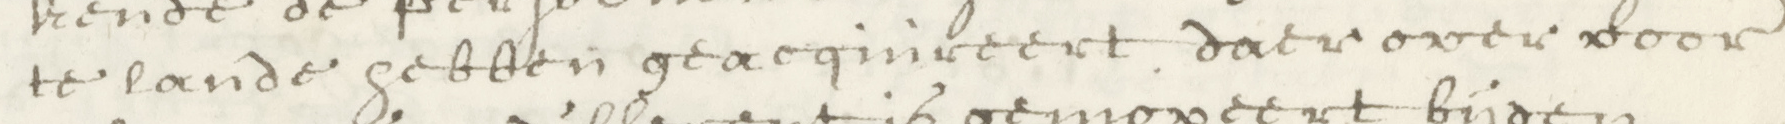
te lande hebben geacquireert, daer over voor
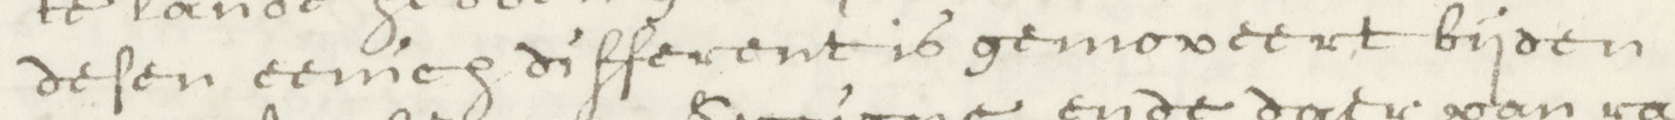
desen eenich different is gemoveert bijden
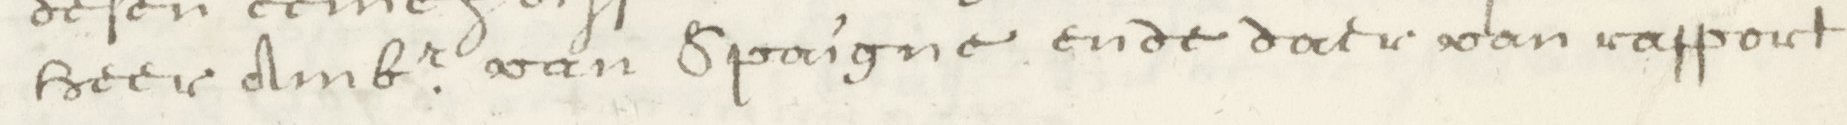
heer Ambr. van Spaigne, ende daer van rapport
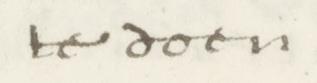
te doen.
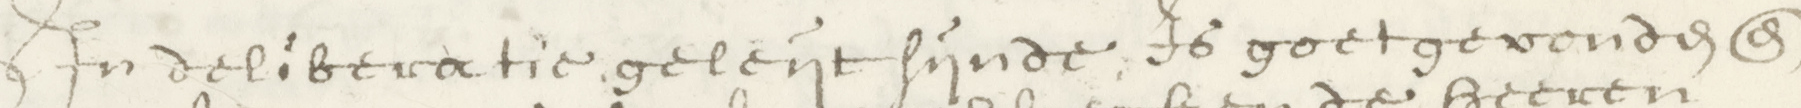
In deliberatie geleijt sijnde, Is goetgevonden &
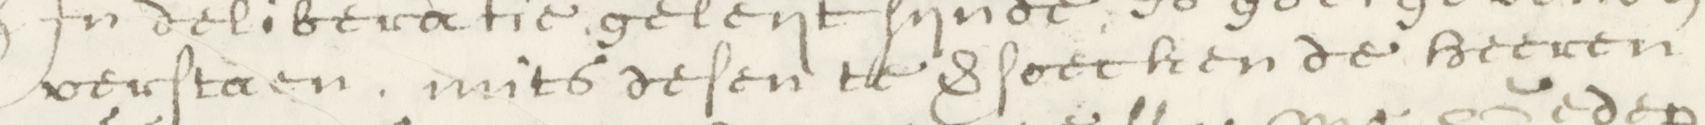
verstaen, mits desen te vsoecken de heeren
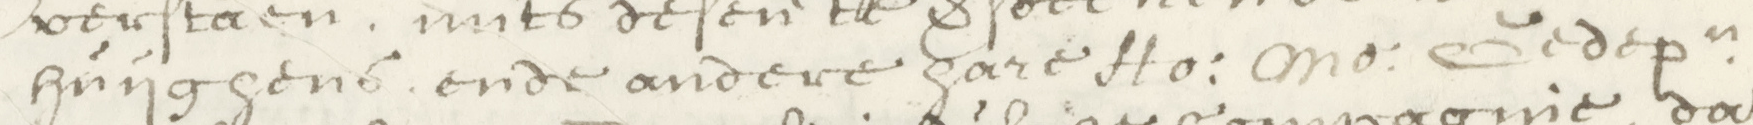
huijghens, ende andere hare Ho:Mo: Gedepn.
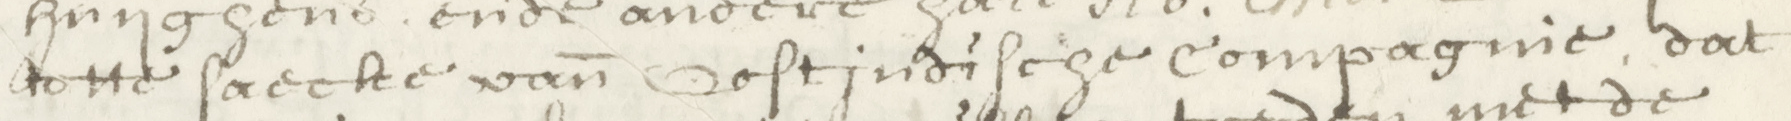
totte saecke van Oostindische Compagnie, dat
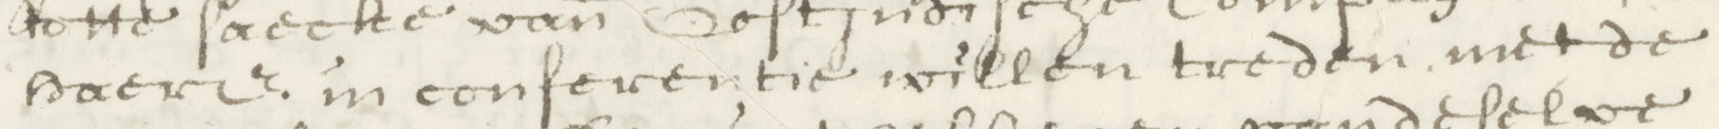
haer E. in conferentie willen treden, met de
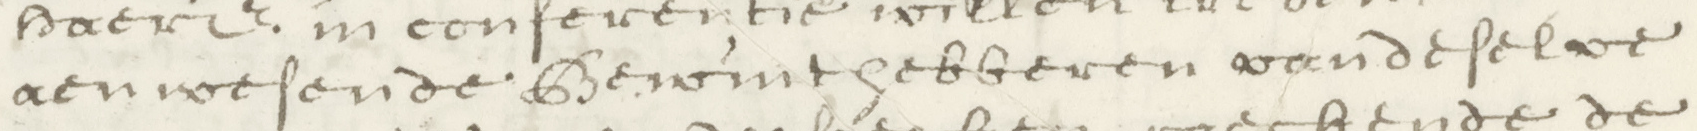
aenwesende Bewinthebberen van deselve
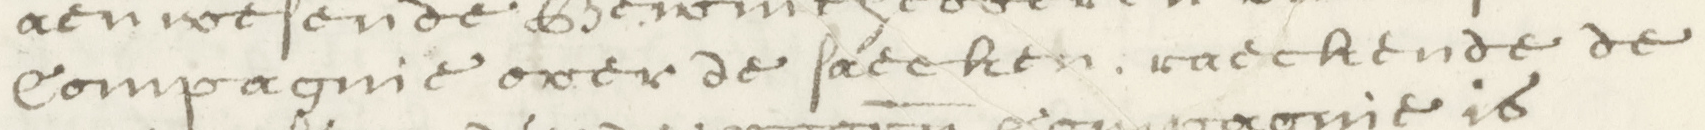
Compagnie over de saecken, raeckende de
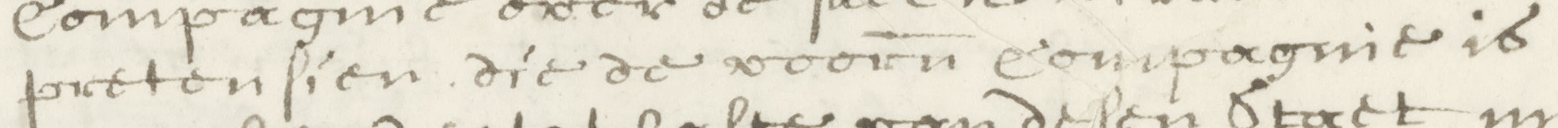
pretensien, die de voorn compagnie is
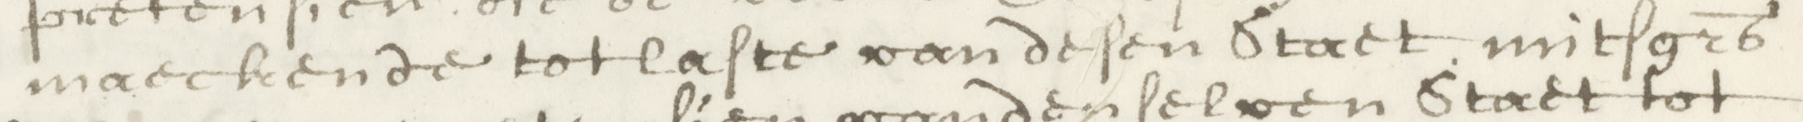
maeckende tot laste van desen Staet mitsgrs
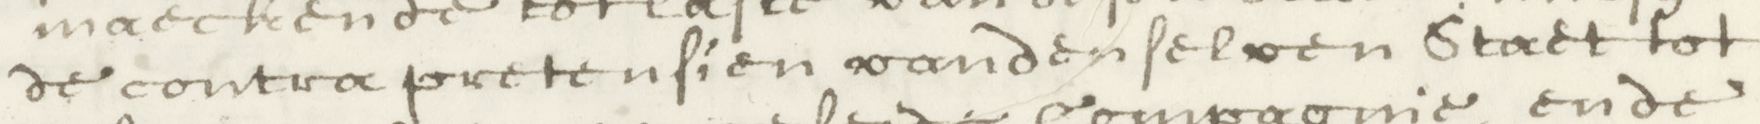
de contra pretensien vanden selven Staet tot
